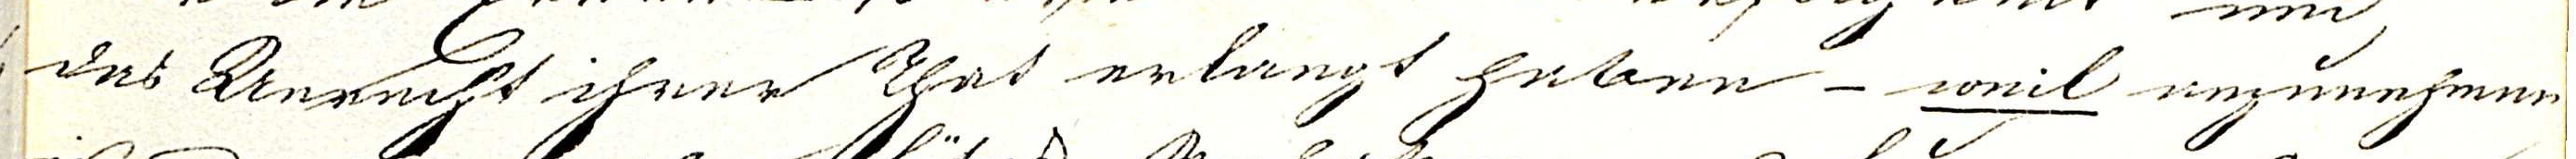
das Unrecht ihrer That erlangt haben - weil anzunehmen
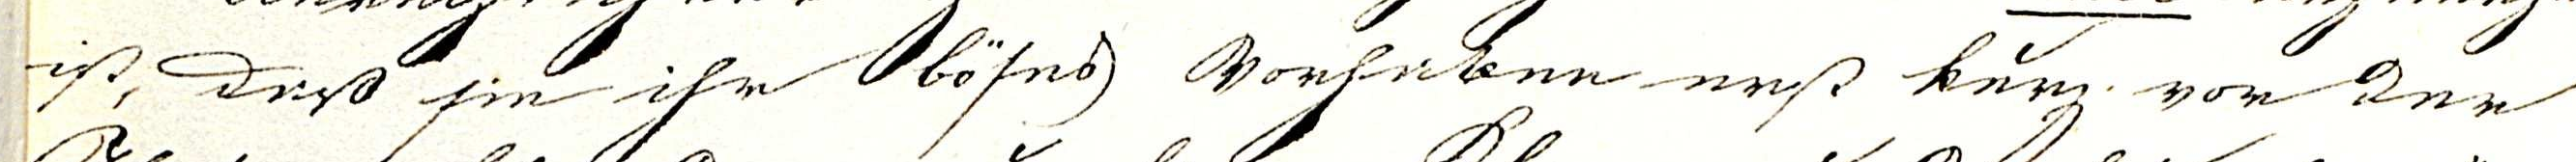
ist, daß sie ihre böses Vorhaben erst kurz vor der
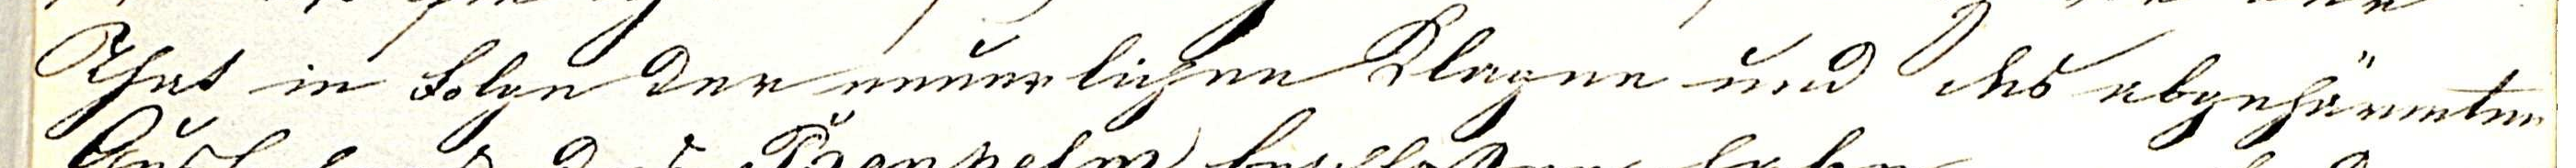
That in Folge der neuerlichen Klagen und des abgehärmten
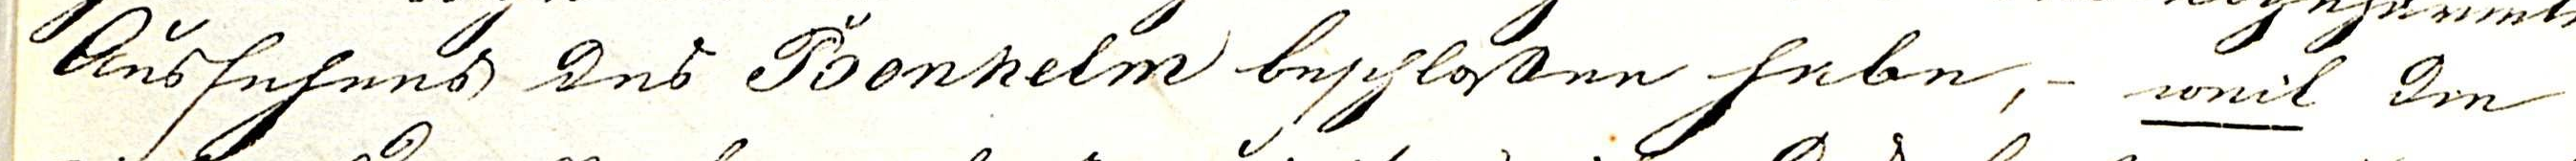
Aussehens des Bonhelm beschloßen habe,- weil die
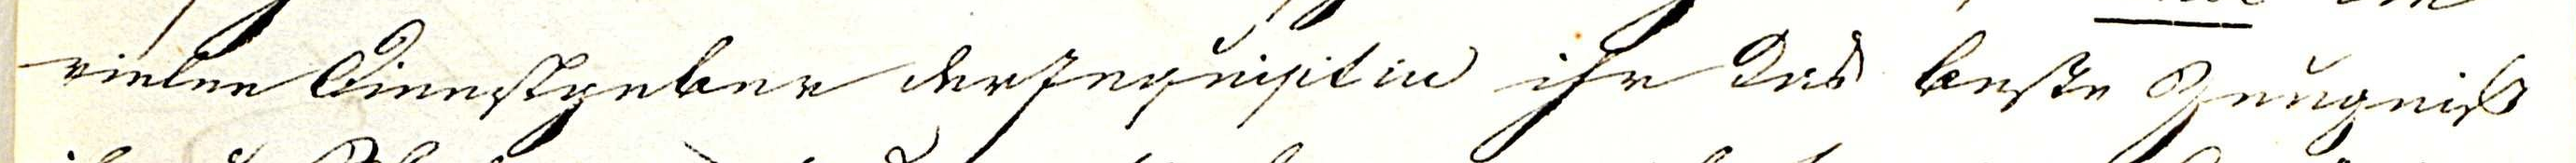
vielen Dienstgeber der Jnquisitin ihr das beste Zeugniß
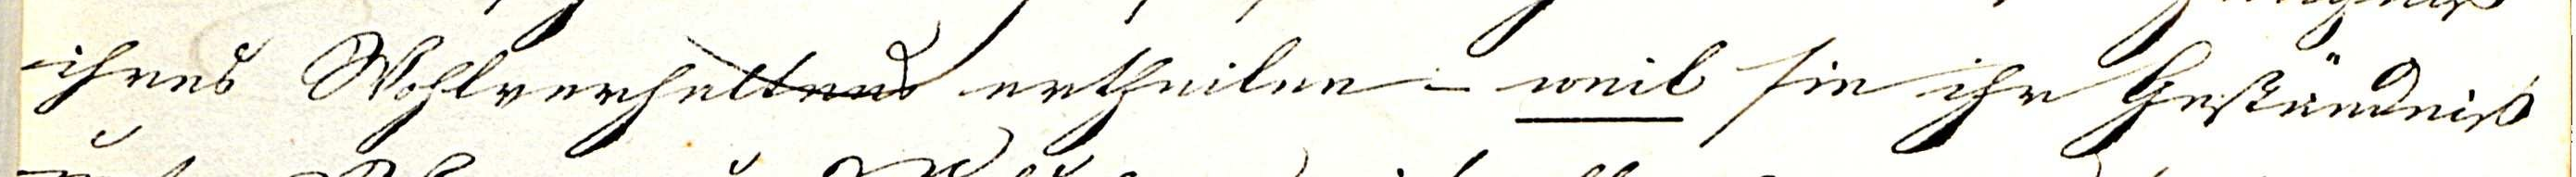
ihres Wohlverhaltens ertheilen - weil sie ihr Geständniß
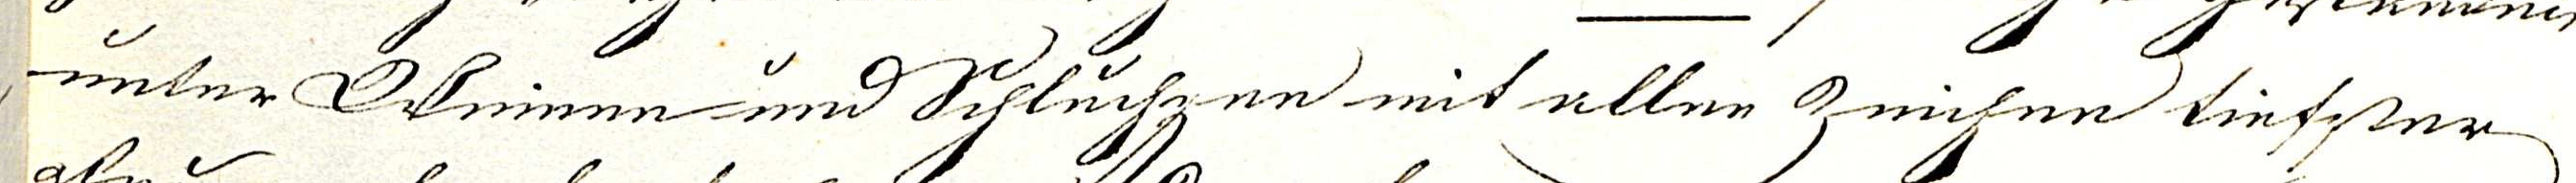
unter Weinen und Schluchzen mit allen Zeichen tiefster
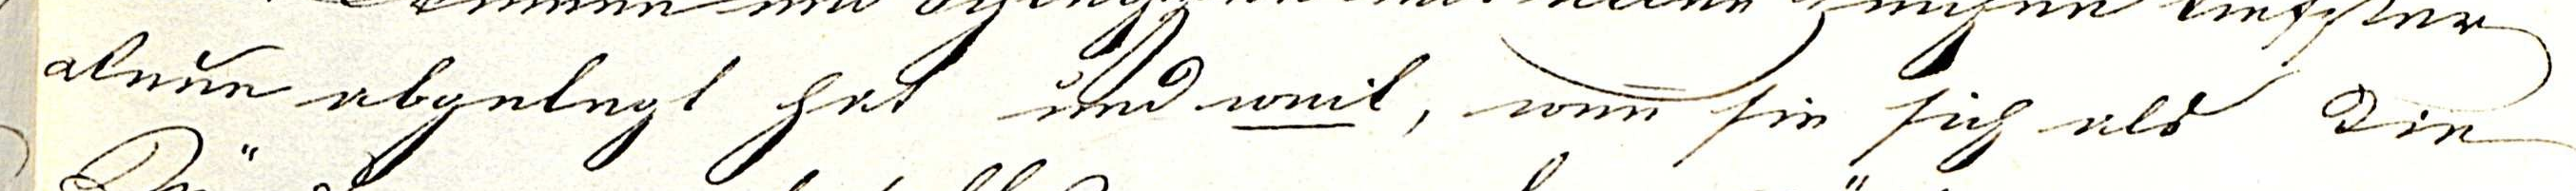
Reue abgelegt hat und weil, wenn sie sich als die
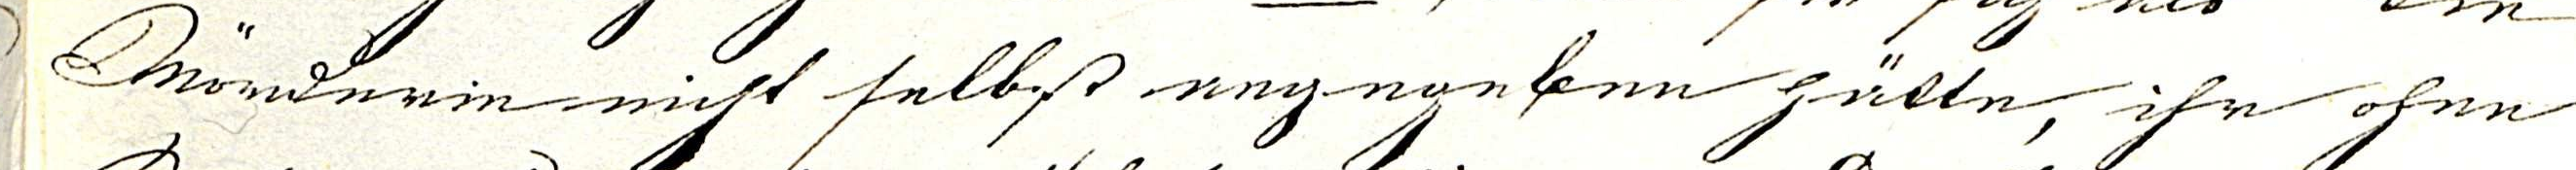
Mörderin nicht selbst angegeben hätte, ihr ohne
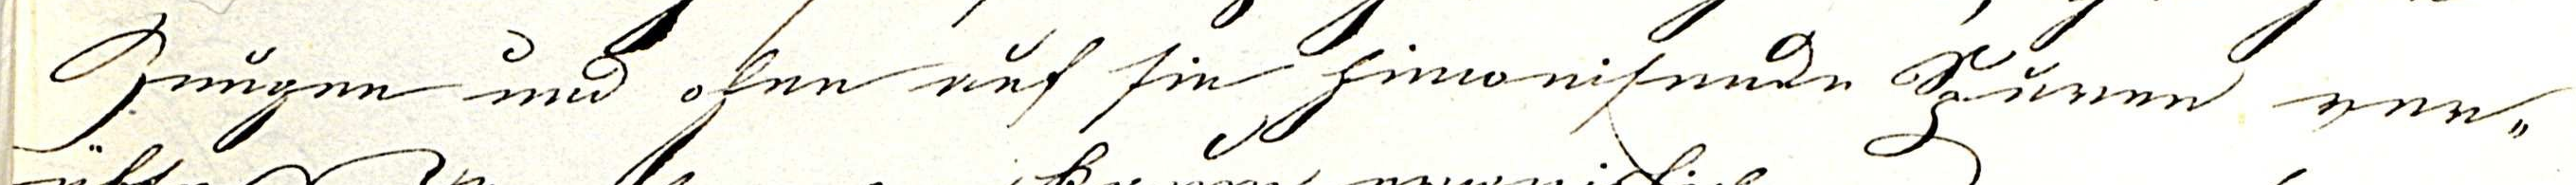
Zeugen und ohne auf sie himonisende Spuren ver¬
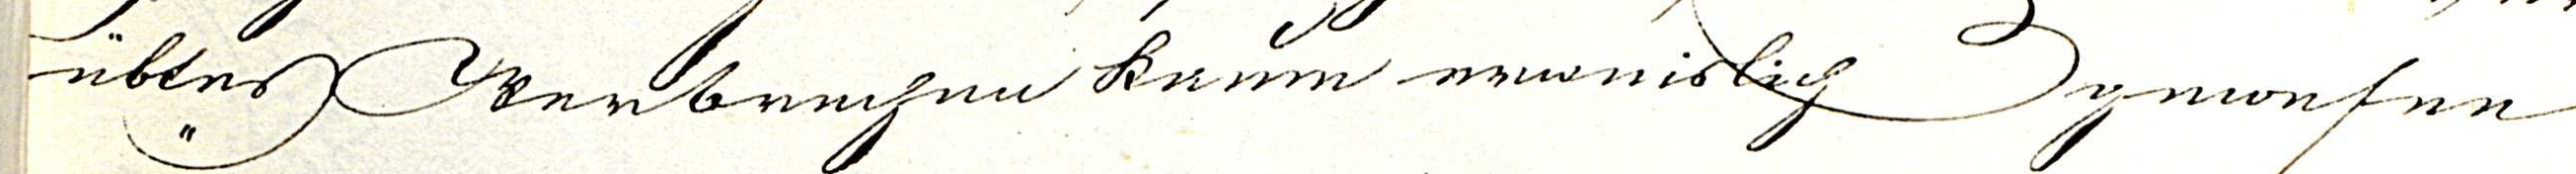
übtes Verbrechen kaum erweislich gewesen
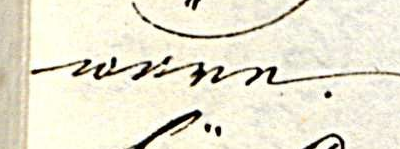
wäre.
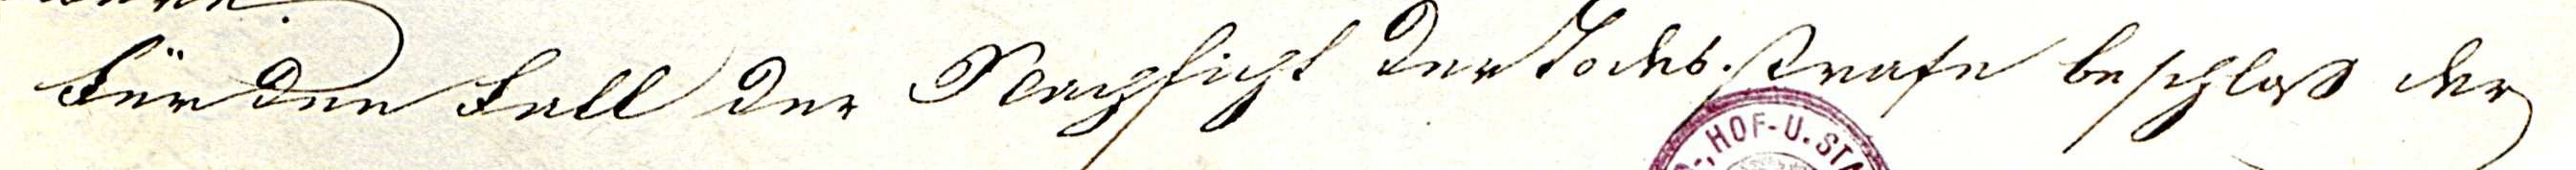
Für den Fall der Nachsicht der Todesstrafe beschloß der
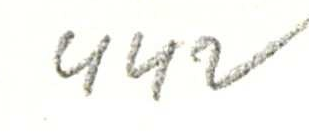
442
